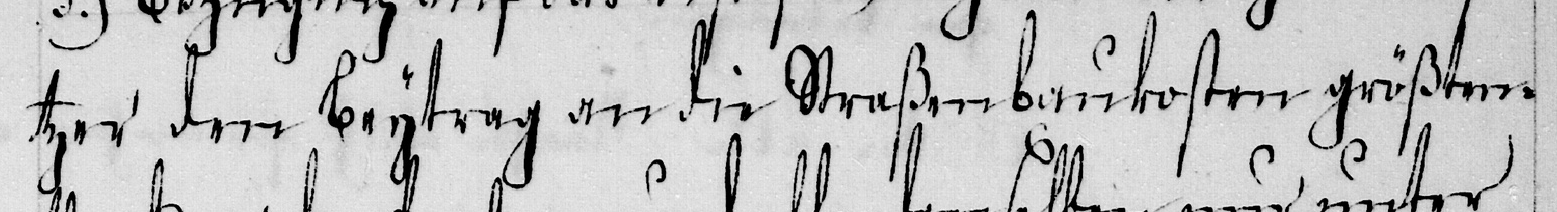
tzer den Beytrag an die Straßenbaukosten größten¬
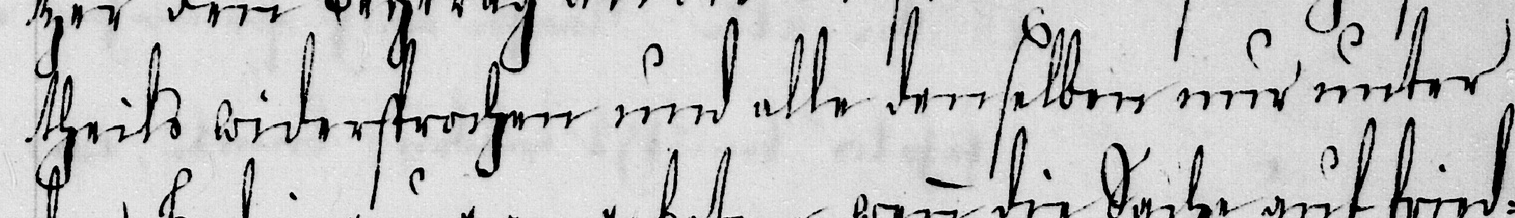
theils widersprochen und alle denselben nur unter
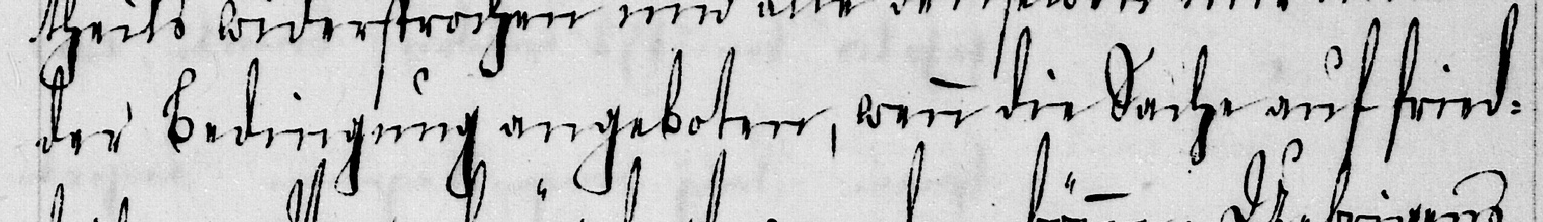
der Bedingung angeboten, wenn die Sache auf fried¬
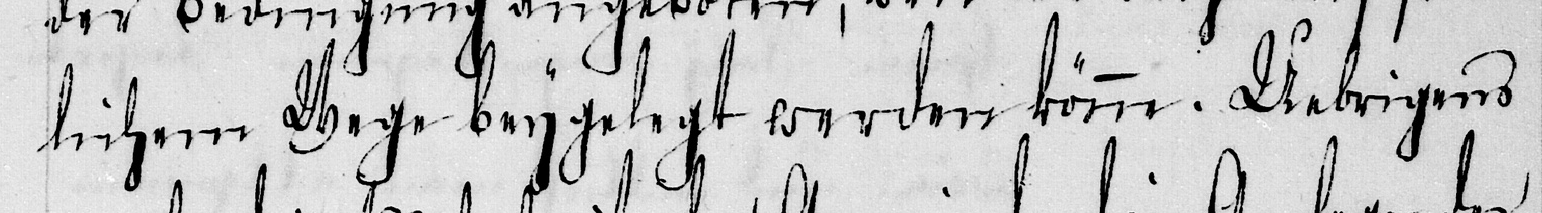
lichem Wege beygelegt werden könne. Uebrigens
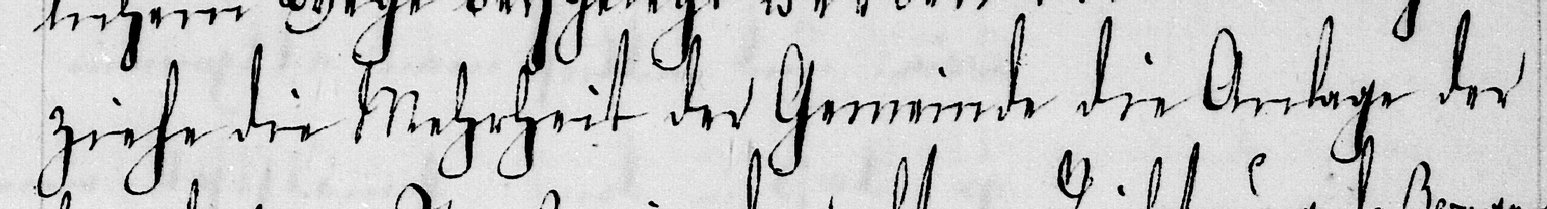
ziehe die Mehrheit der Gemeinde die Anlage der
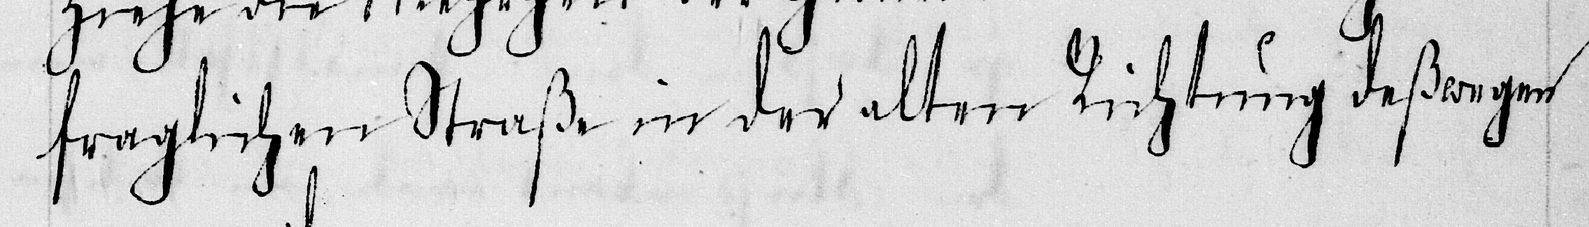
fraglichen Straße in der alten Richtung deßwegen
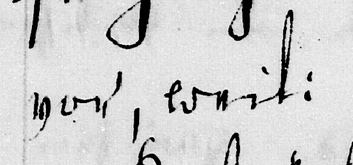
vor, weil:
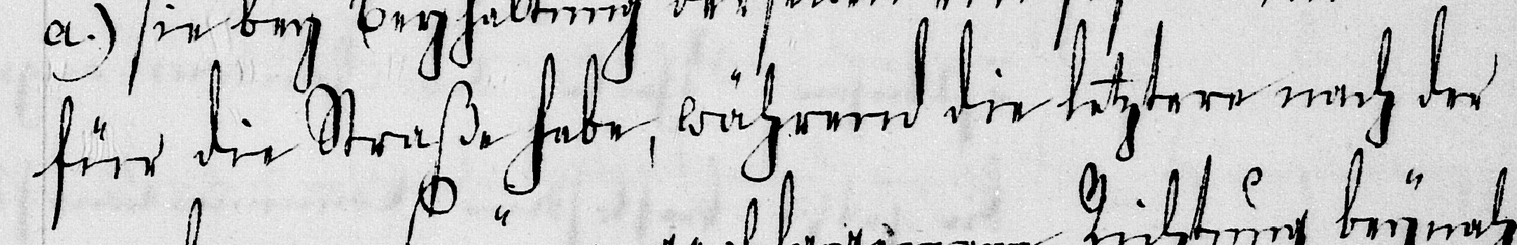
für die Straße habe, während die letztere nach der
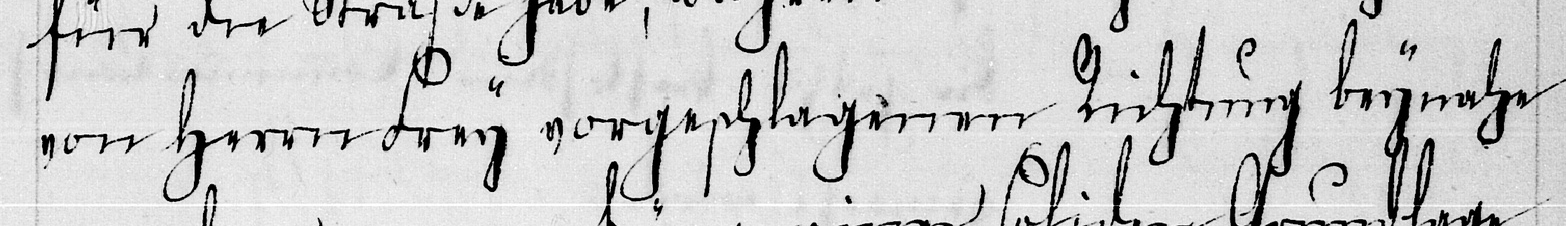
von Herrn Frey vorgeschlagenen Richtung beynahe
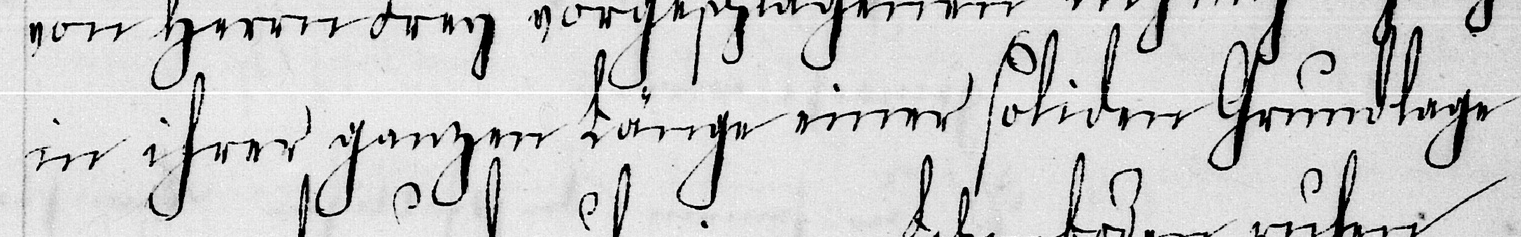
in ihrer ganzen Länge einer soliden Grundlage
